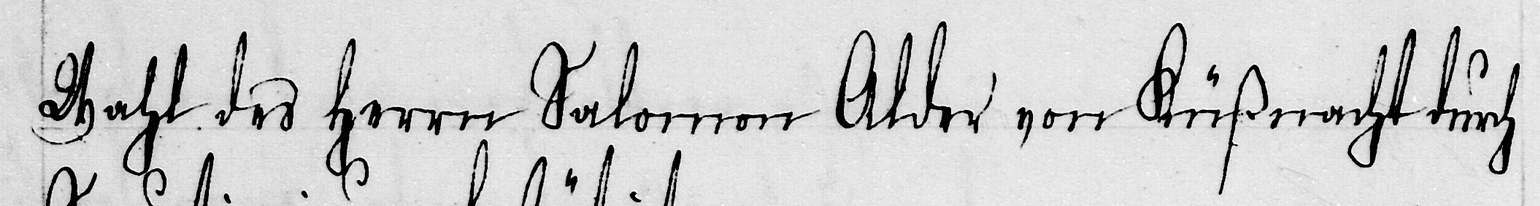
Wahl des Herrn Salomon Alder von Küßnacht durch
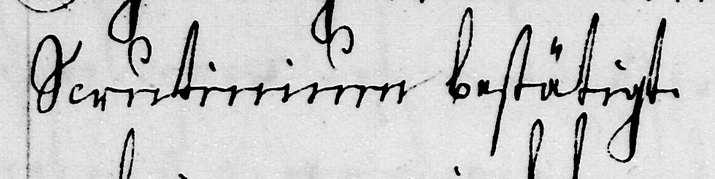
Scrutinium bestätigt.
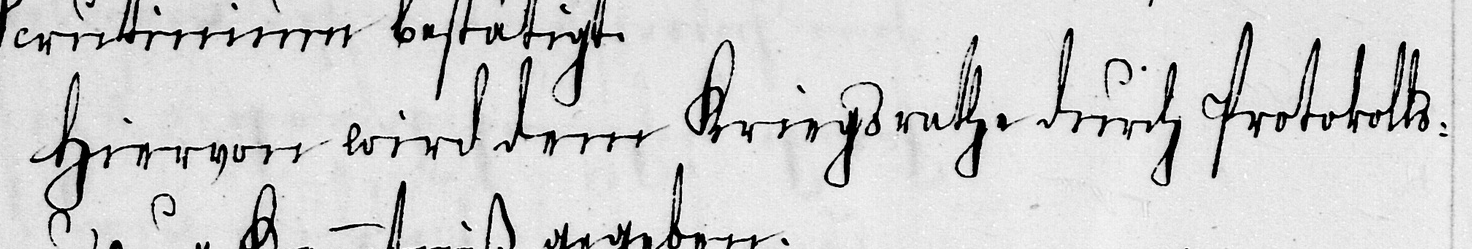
Hiervon wird dem Kriegsrathe durch Protokoll¬
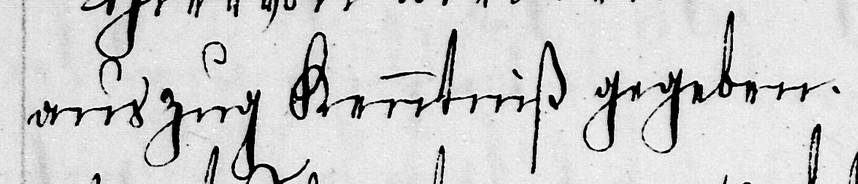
sauszug Kenntniß gegeben.
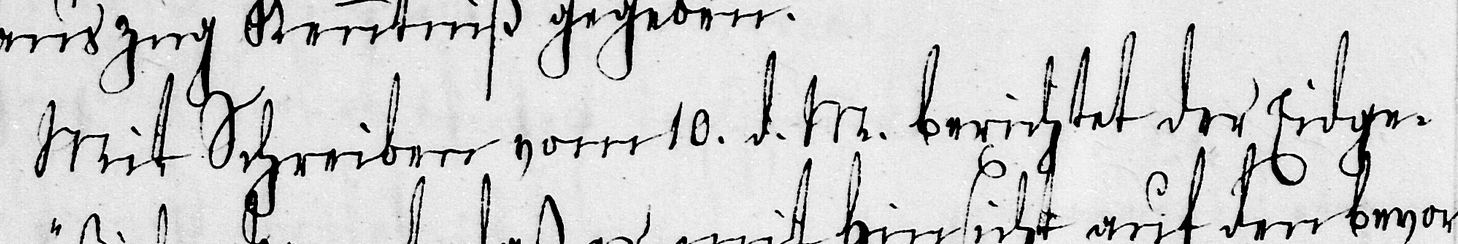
Mit Schreiben vom 10. d. M. berichtet der Eidge¬
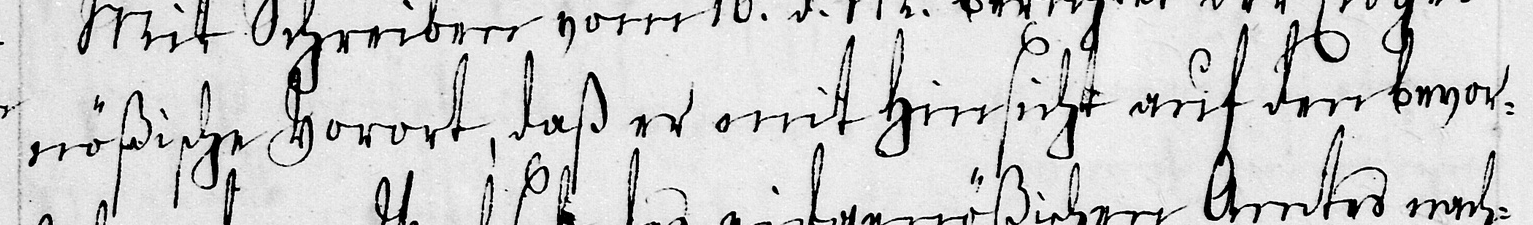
nößische Vorort, daß er mit Hinsicht auf den bevor¬
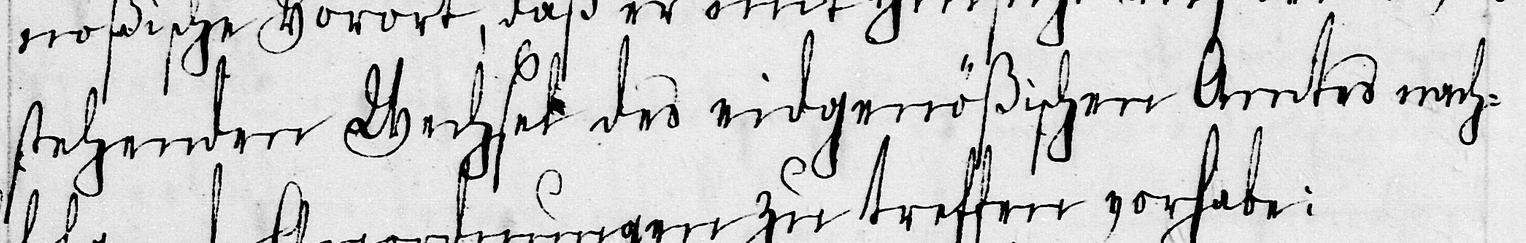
stehenden Wechsel des eidgenößischen Amtes nach¬
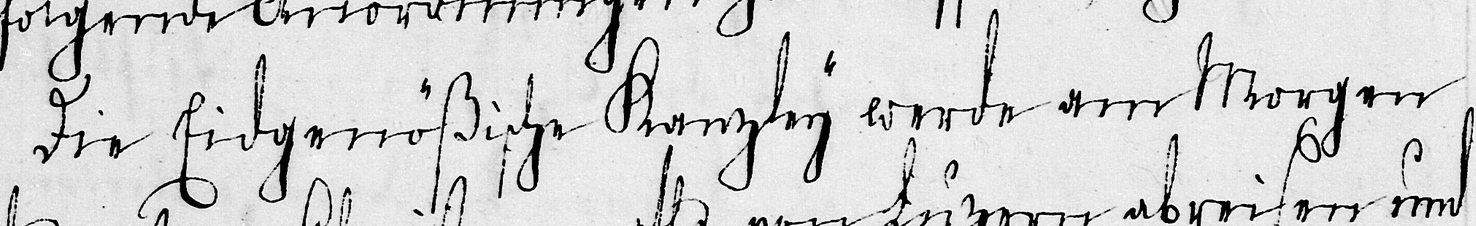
Die Eidgenößische Kanzley werde am Morgen
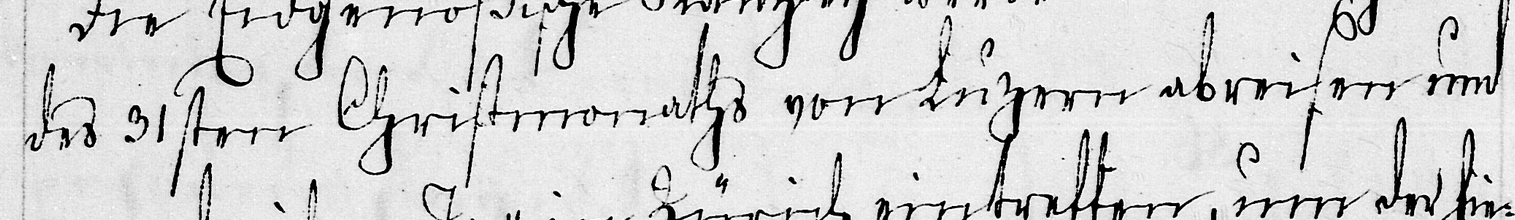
des 31sten Christmonaths von Luzern abreisen und
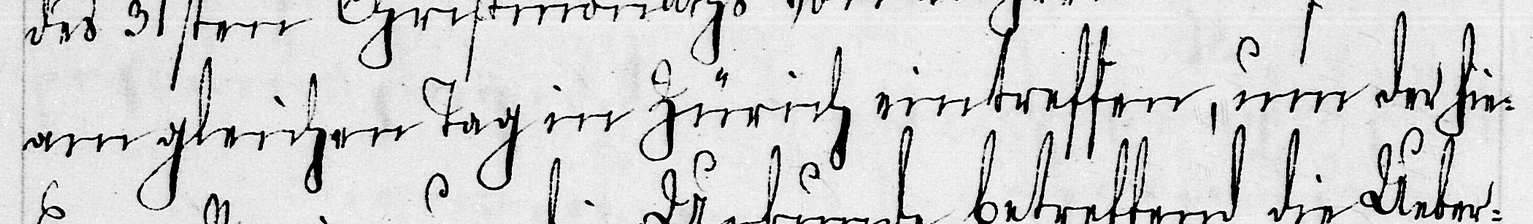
am gleichen Tag in Zürich eintreffen, um der hie¬
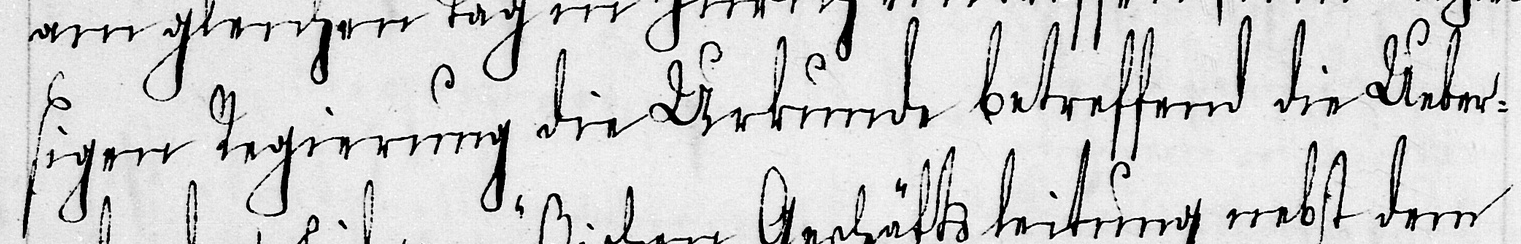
sigen Regierung die Urkunde betreffend die Ueber¬
